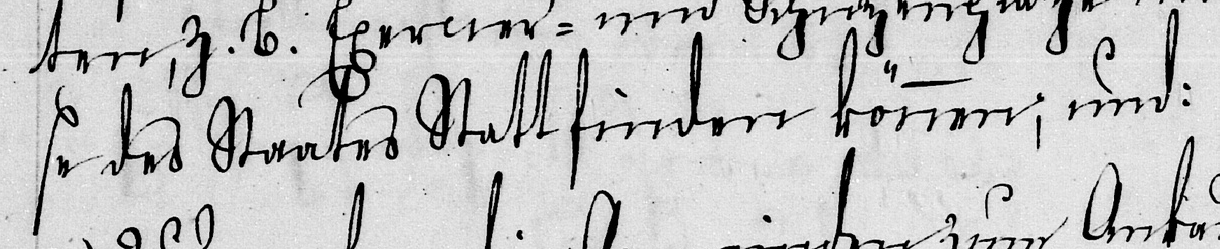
ße des Staates Statt finden können, und:
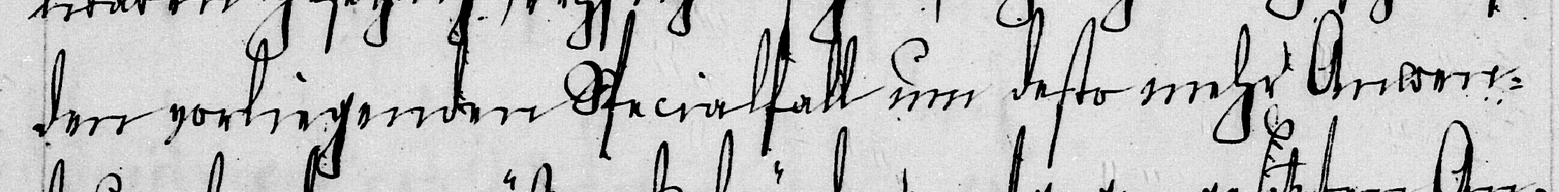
den vorliegenden Specialfall um desto mehr Anwen¬
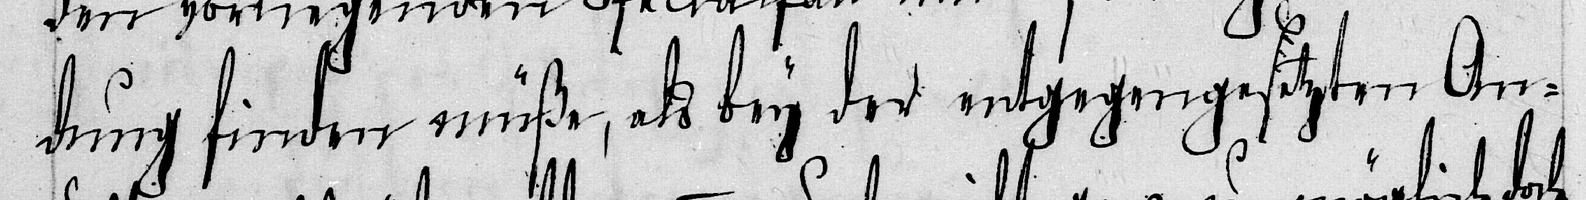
dung finden müße, als bey der entgegengesetzten An¬
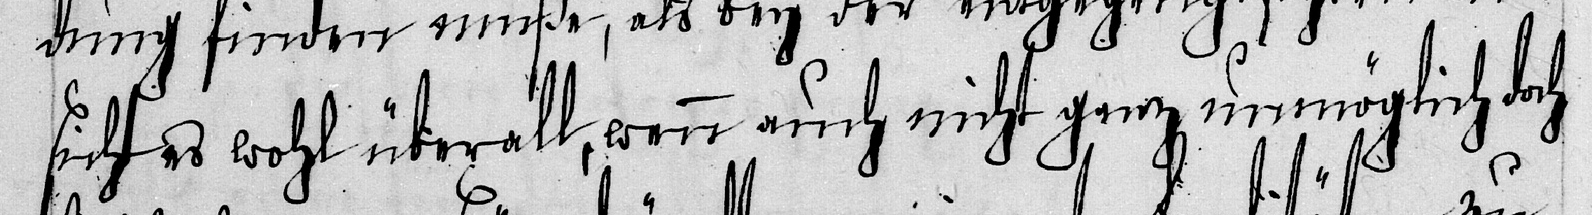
sicht es wohl überall, wenn auch nicht ganz unmöglich doch
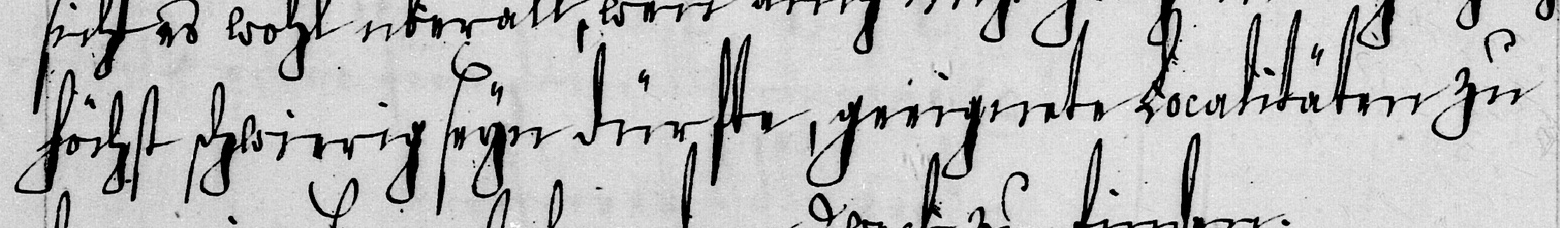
höchst schwierig seyn dürfte, geeignete Localitäten zu
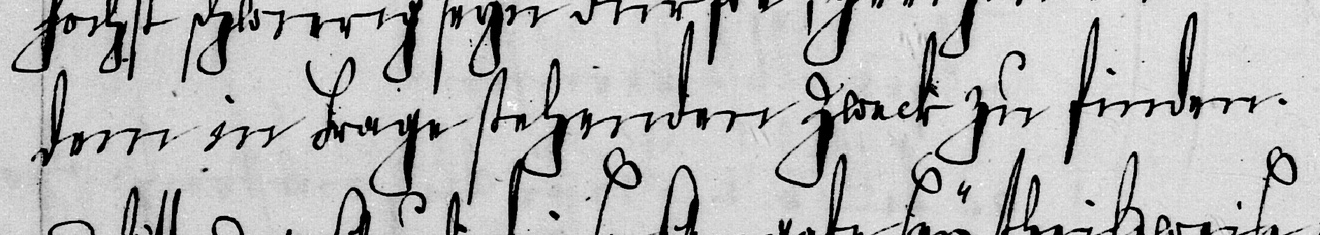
dem in Frage stehenden Zweck zu finden.
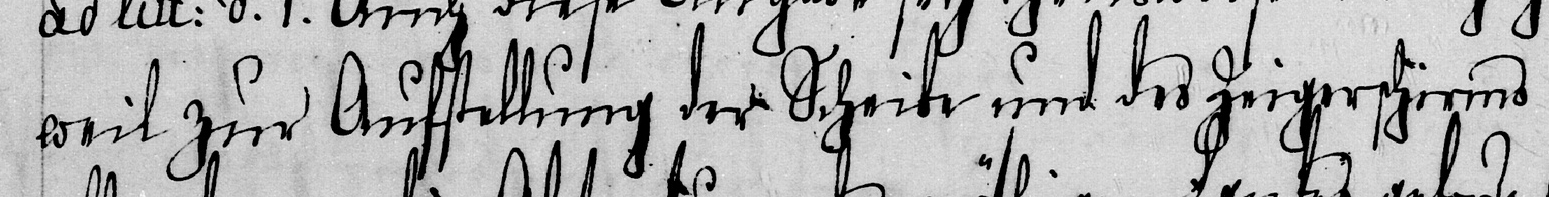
weil zur Aufstellung der Scheibe und des Zeigerschirms
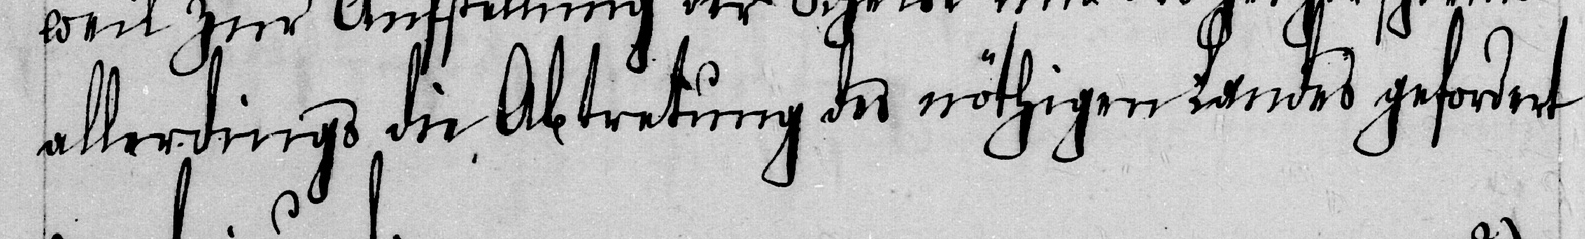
allerdings die Abtretung des nöthigen Landes gefordert
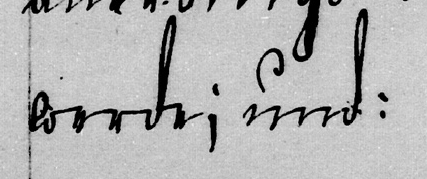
wurde; und:
